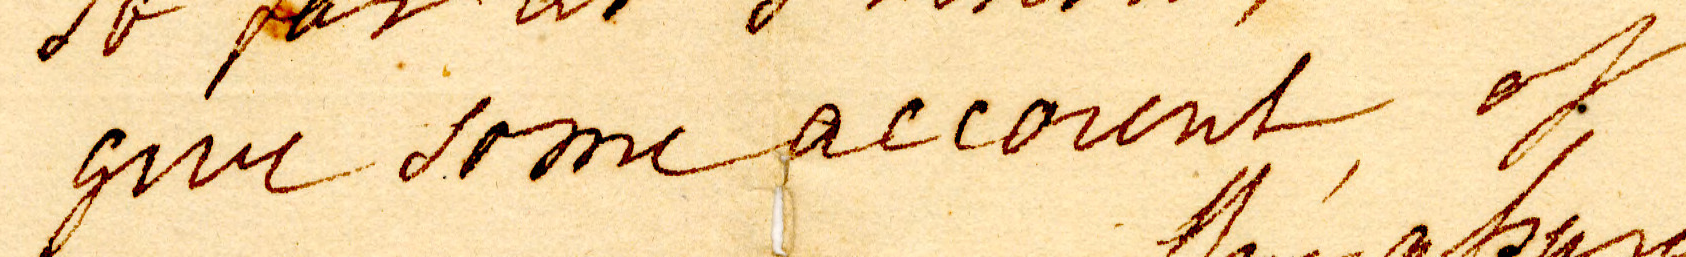give some account, of
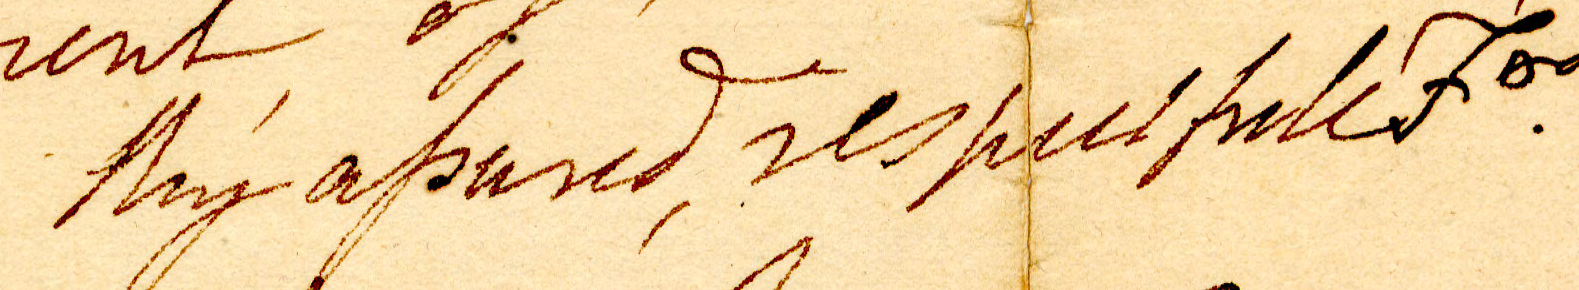Thy assurd, respectfull F^rd.
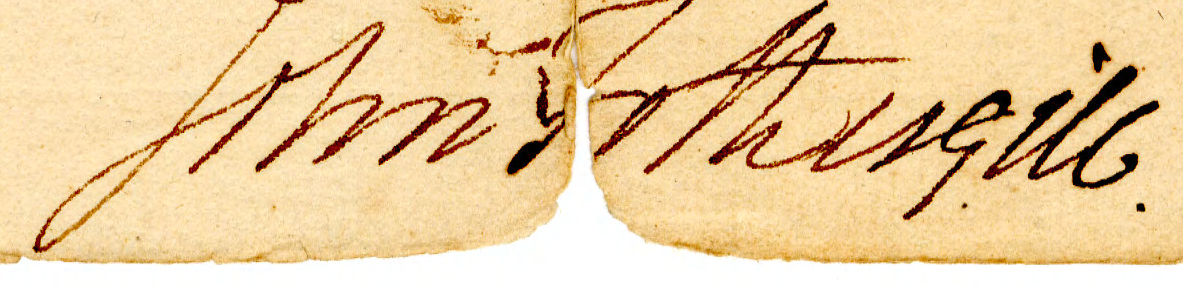John Fothergill.
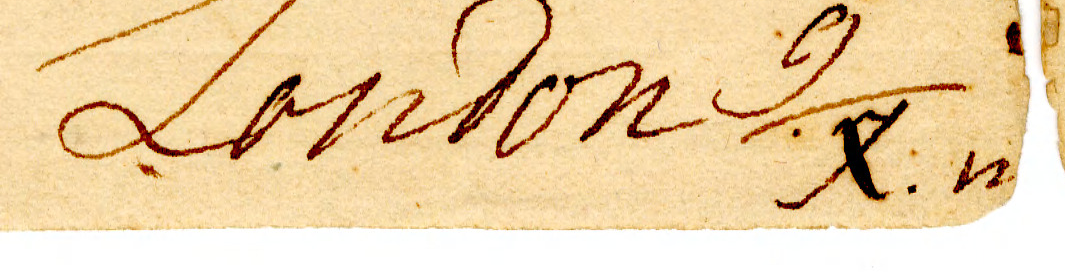London 9^th
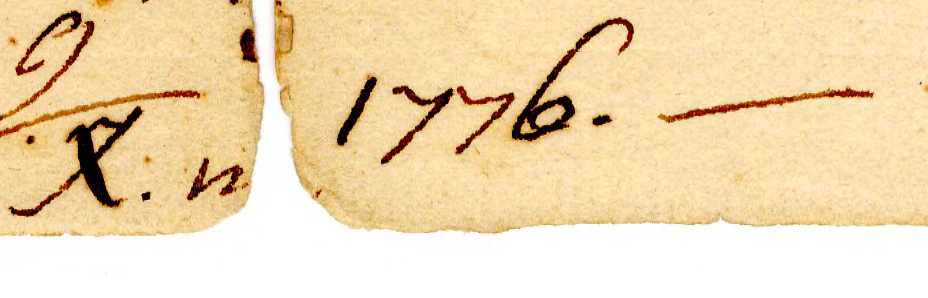X m[o] 1776.-
